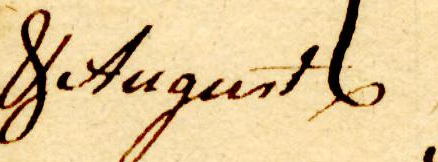& August
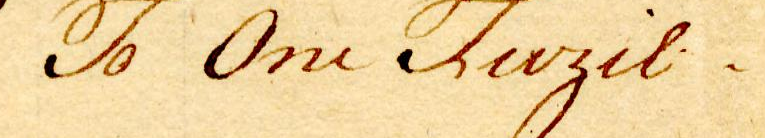To One Tuzil
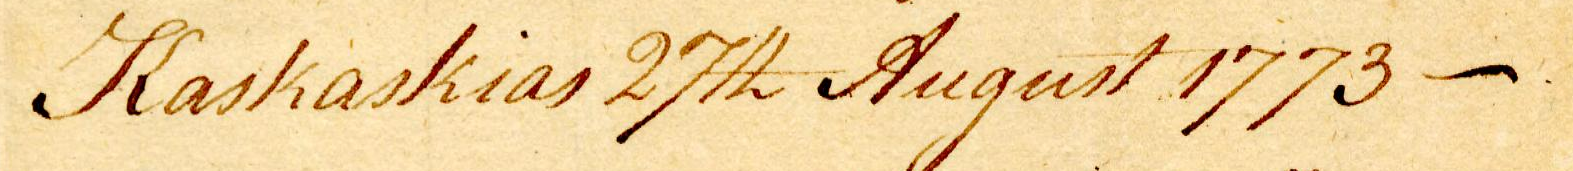Kashaskias 27th August 1773-
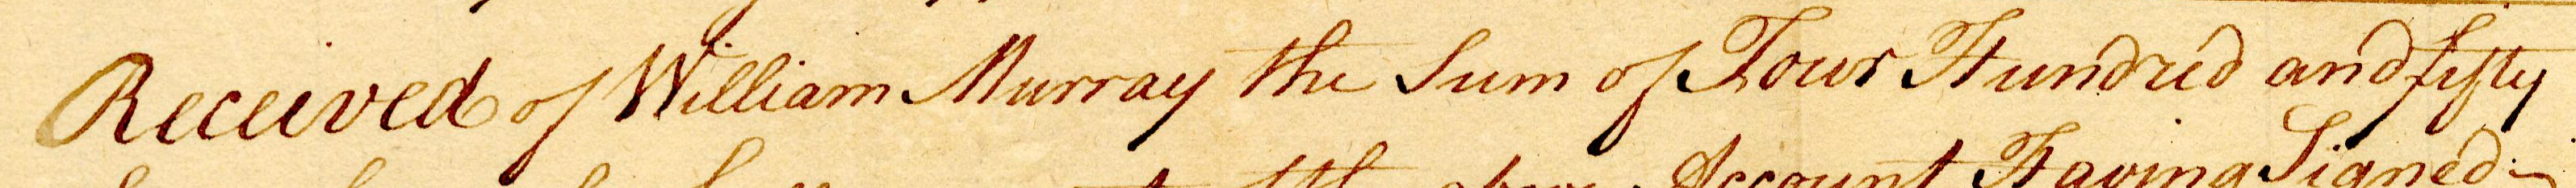Received of William Murray the Sum of Four Hundred and fifty
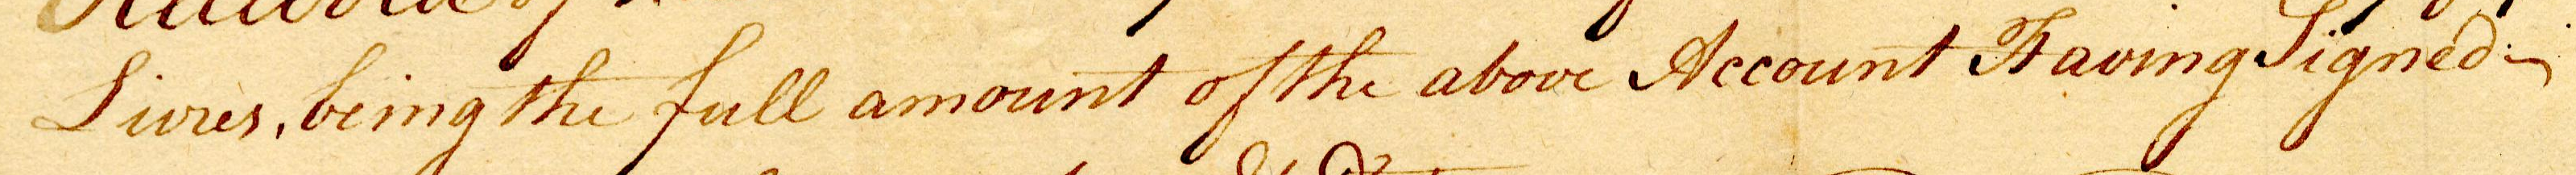Livres, being the full amount of the above Account Having Signed-
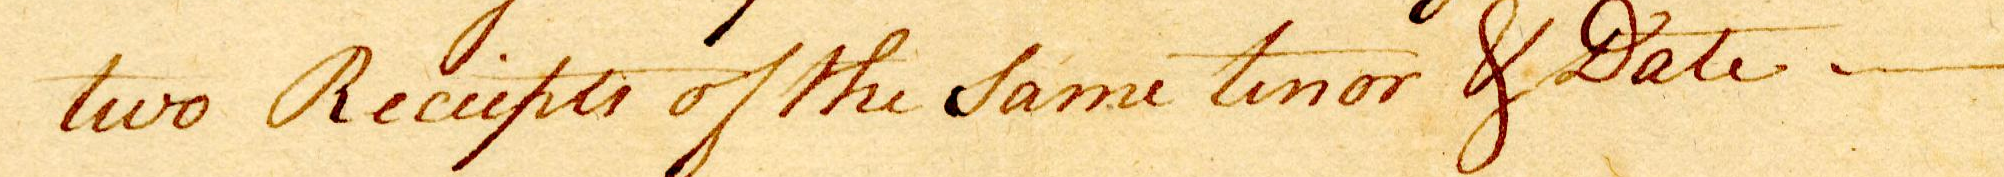two Reciepts of the Same tenor & Date-
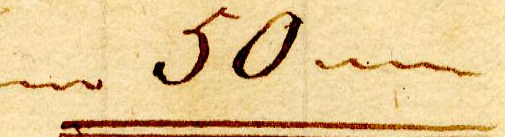50
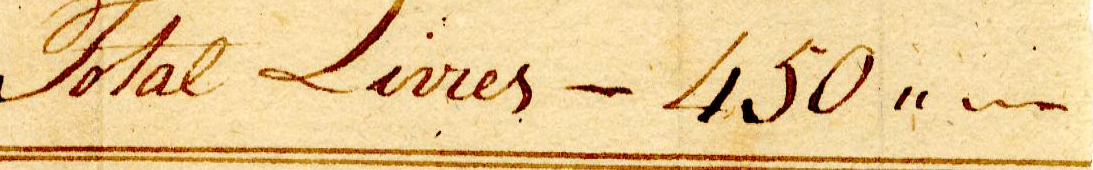Total Livres- 450..-
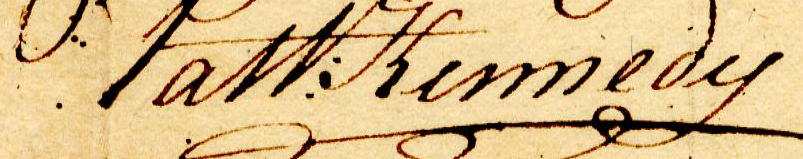Patr^k: Kennedy
